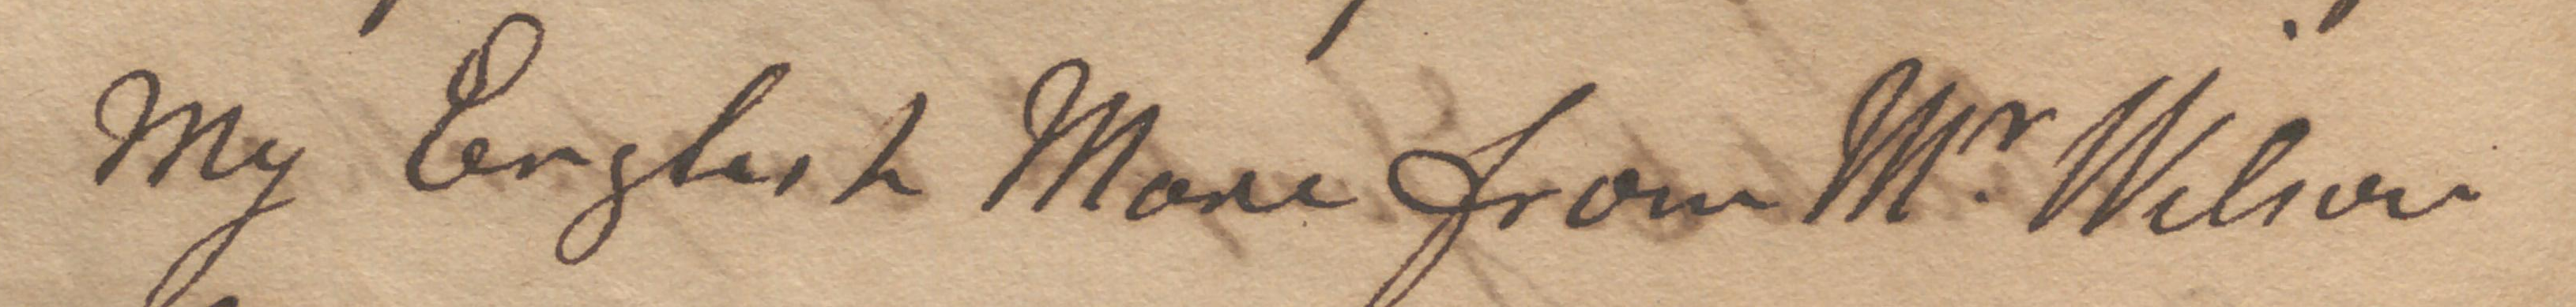My English Mare from M^r. Wilson
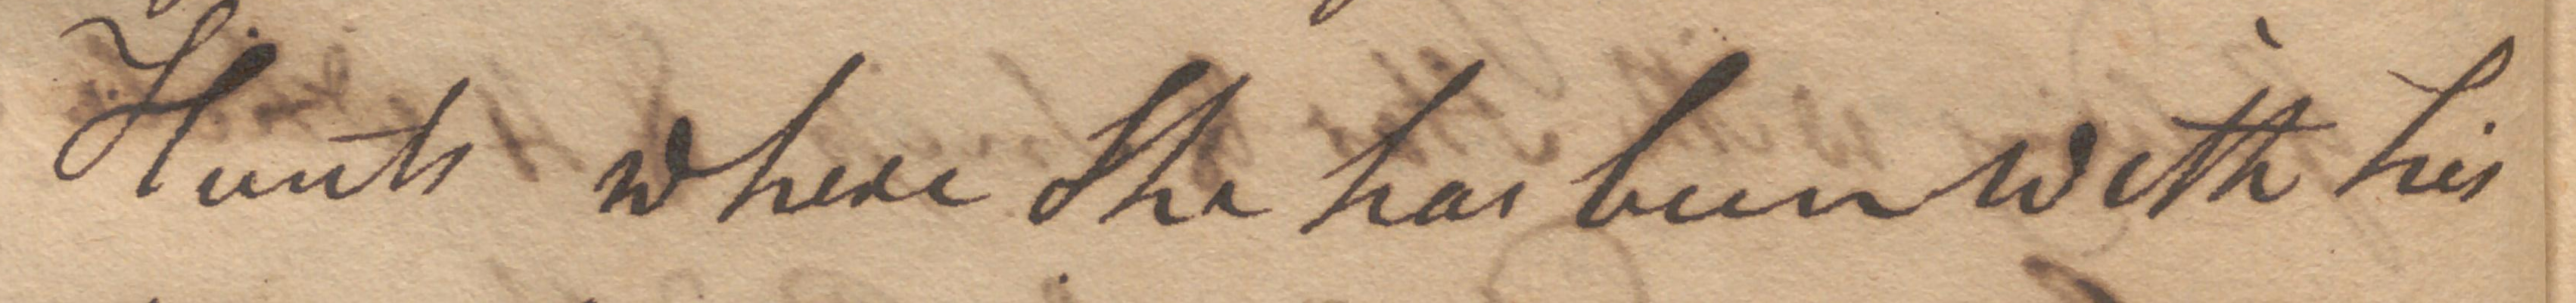Hunts where she has been with his
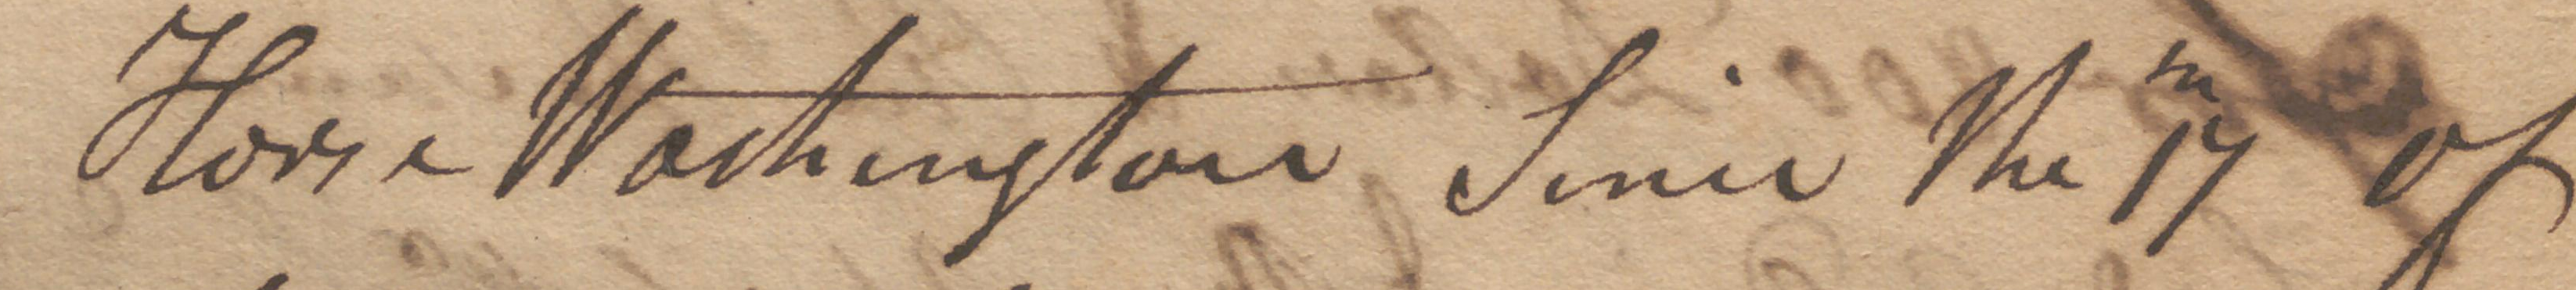Horse Washington since the 17^th of
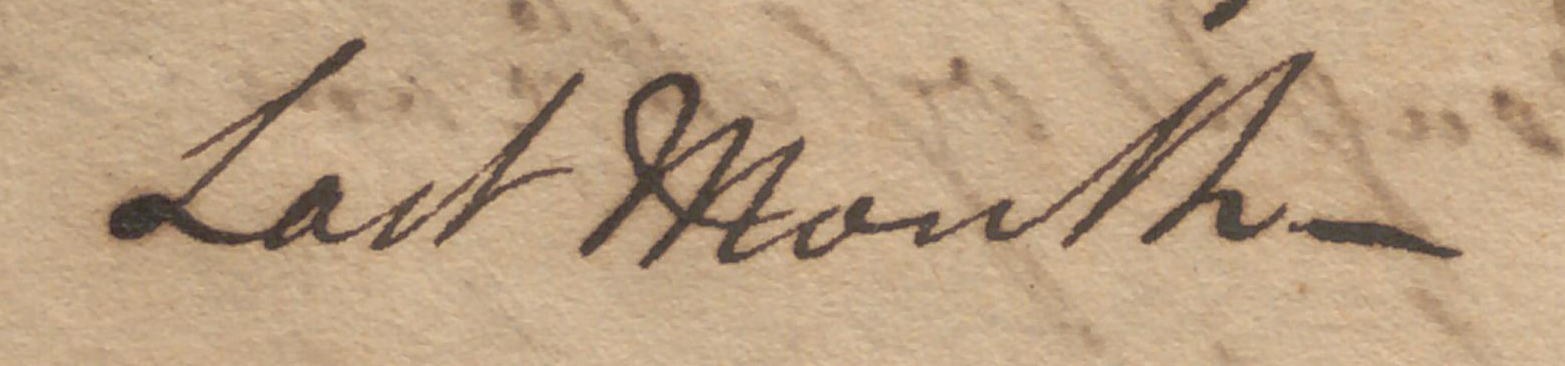Last Month-
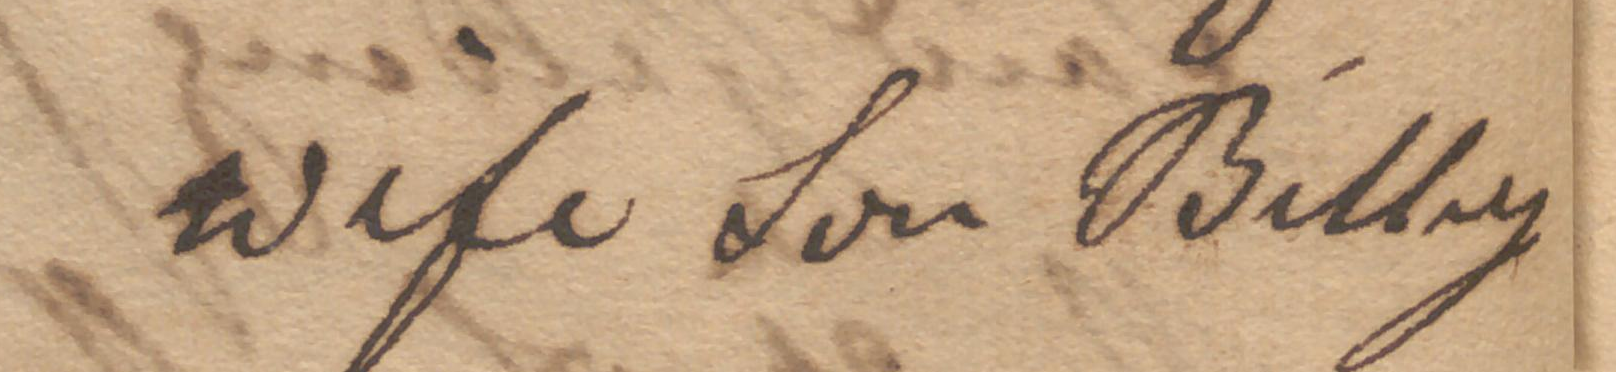wife Son Billey
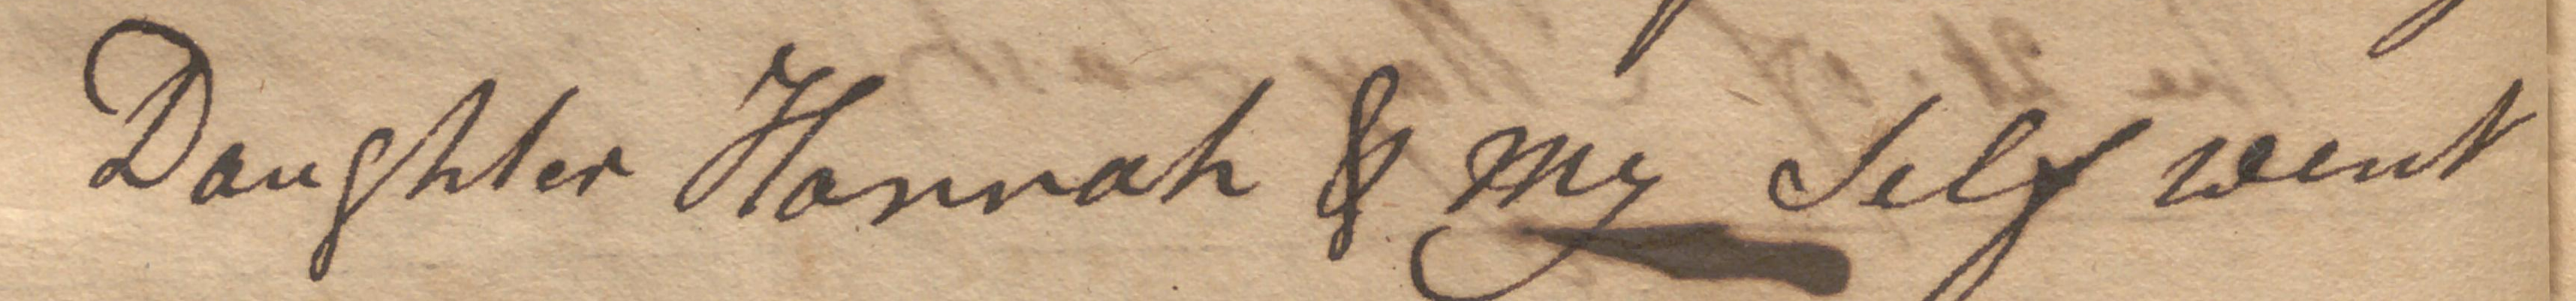Daughter Hannah & my self went
